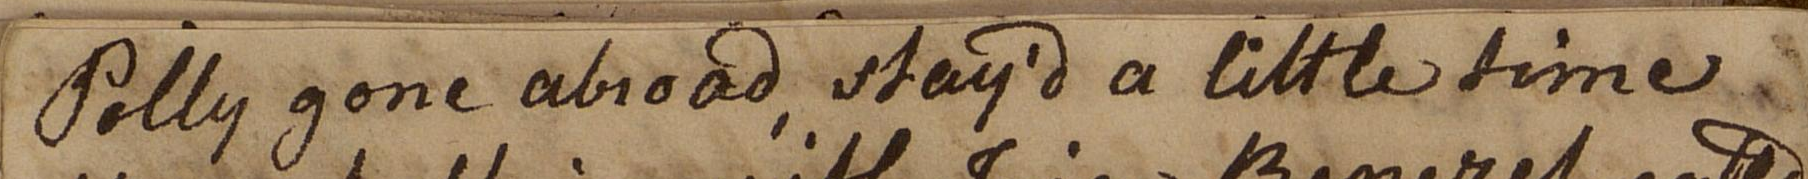Polly gone abroad, stay'd a little time
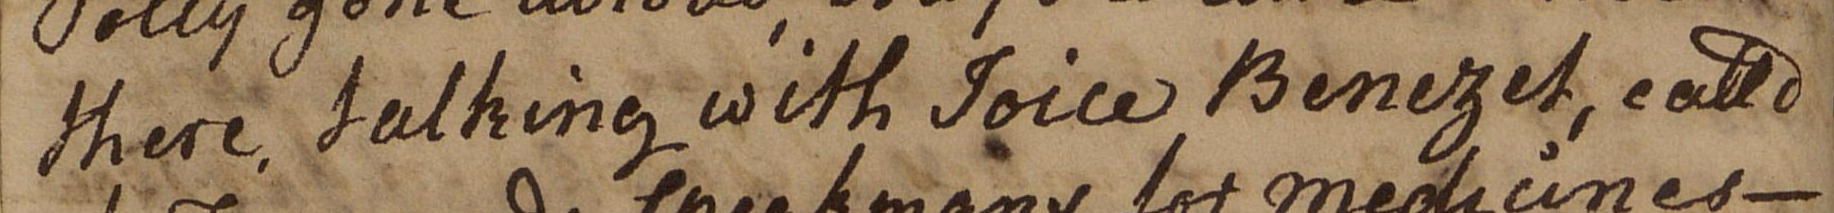there, talking with Joice Benezet, calld
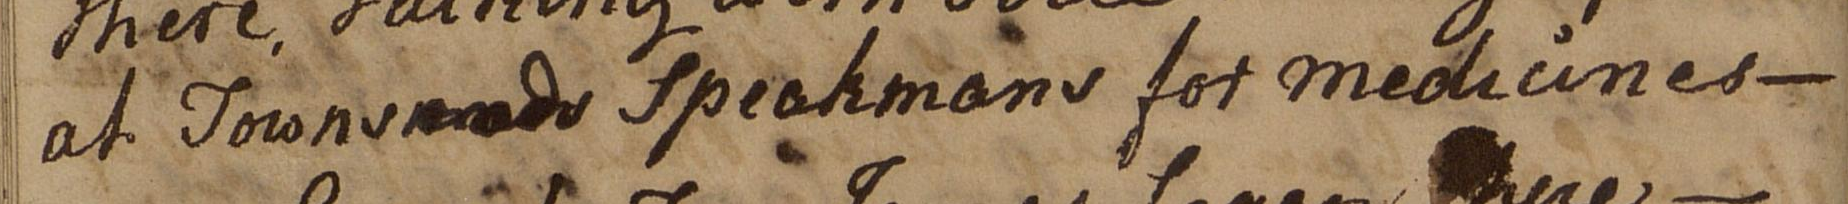at Towns[ends] Speakmans for medicines-
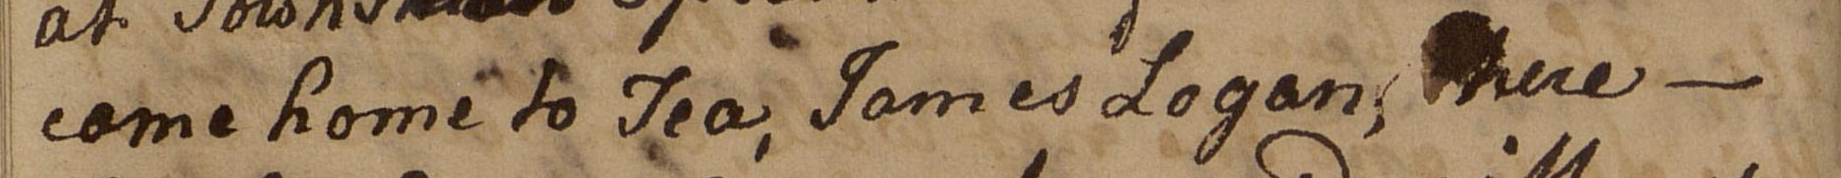came home to Tea, James Logan, here-
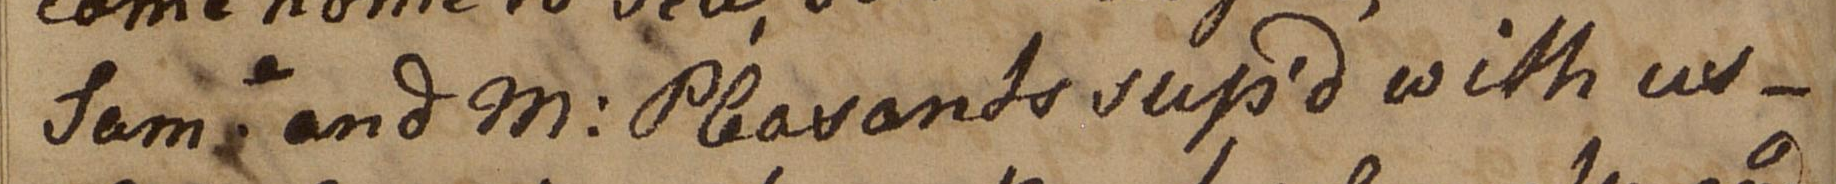Sam^l. and M: Pleasants sup'd with us-
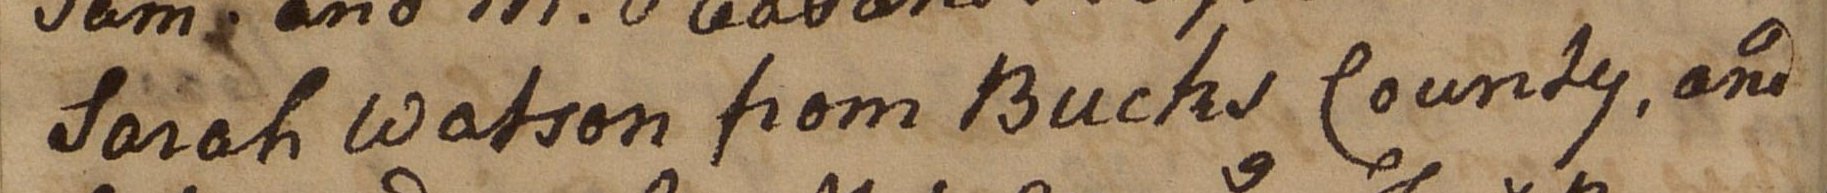Sarah Watson from Bucks County, and
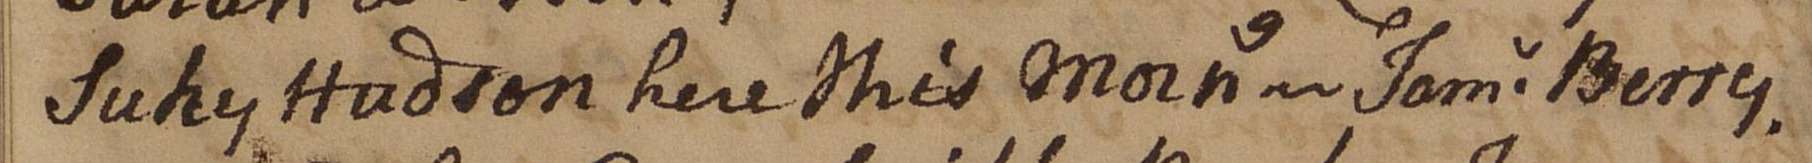Suky Hudson here this Morn^g- Sam^l. Berry,
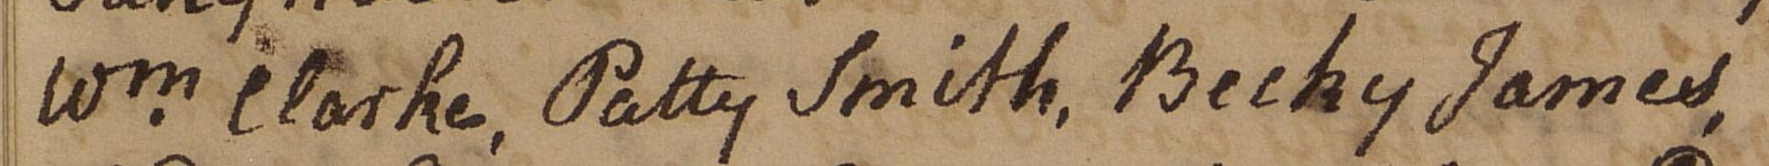W^m. Clarke, Patty Smith, Becky James,
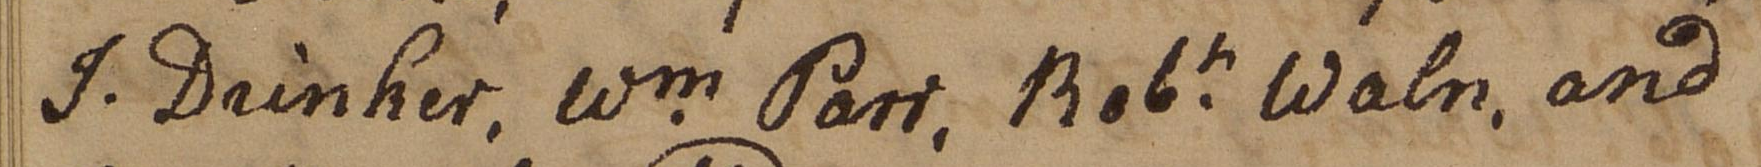I. Drinker, W^m. Parr, Rob^t. Waln, and
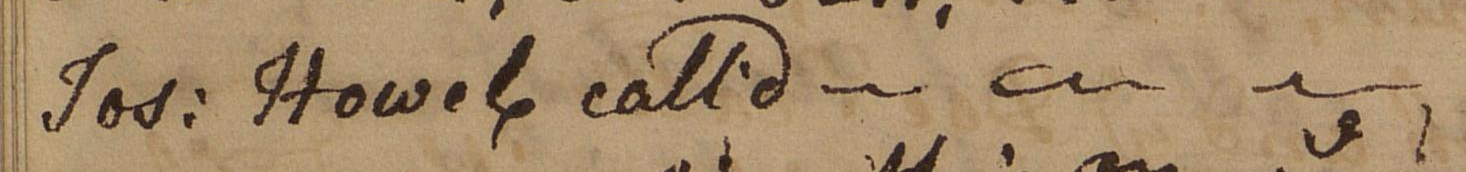Jos: Howel call'd---
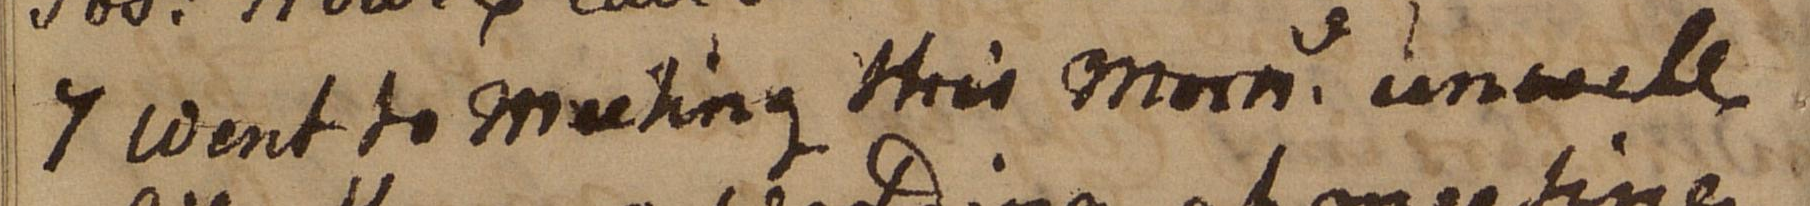7 went to meeting this morn^g. unwell
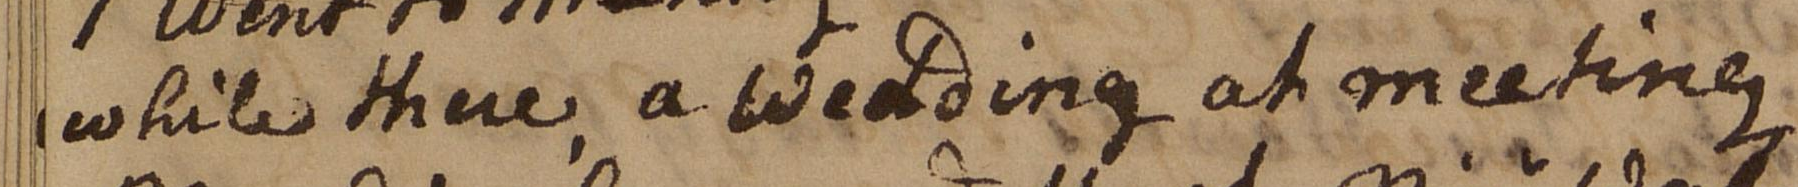while there, a Wedding at meeting
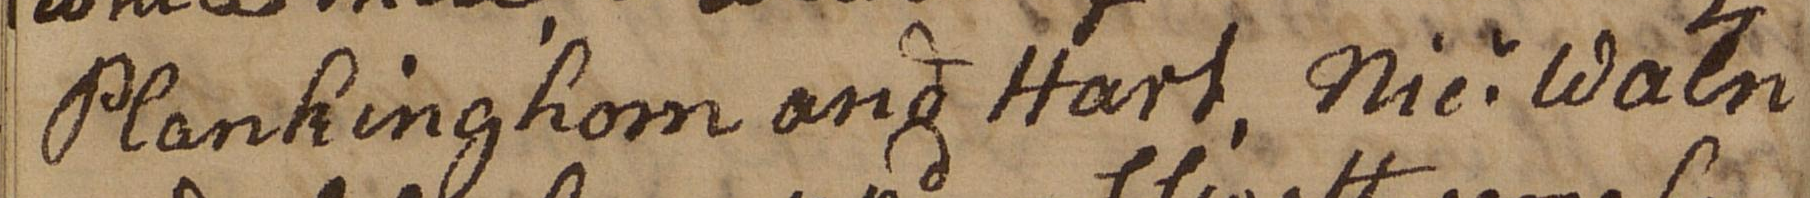Plankinghorn and Hart, Nic^s. Waln
